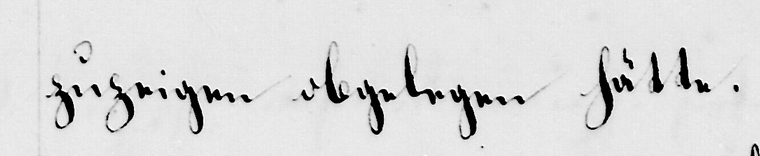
zuzeigen obgelegen hätte.
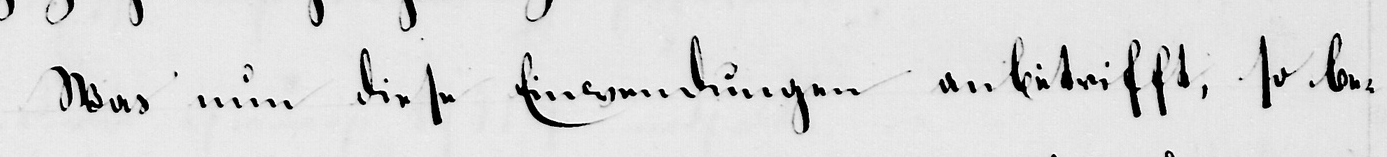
Was nun diese Einwendungen anbetrifft, so be¬
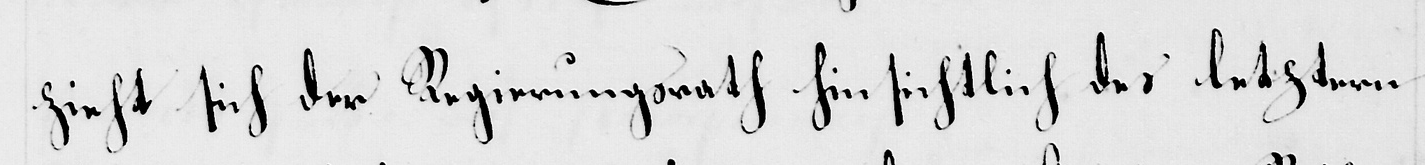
zieht sich der Regierungsrath hinsichtlich des letztern
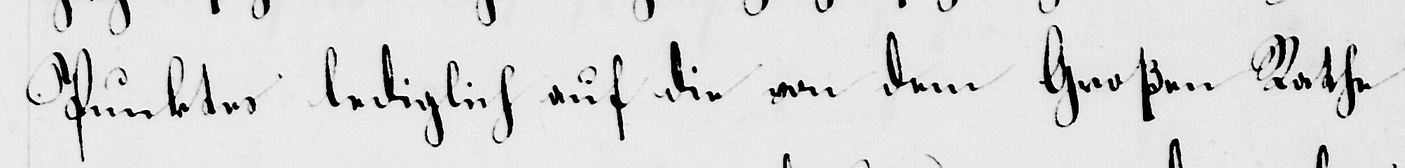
Punktes lediglich auf die von dem Großen Rathe
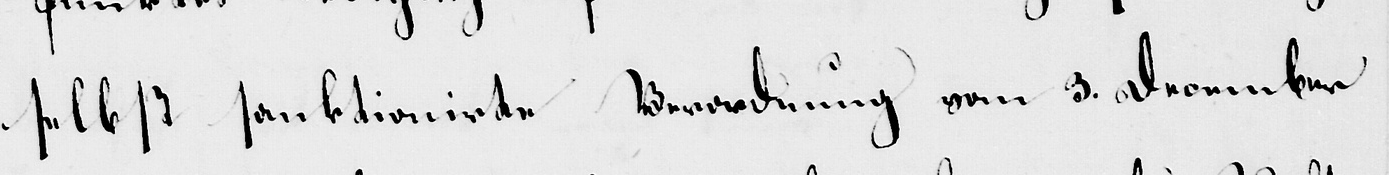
selbst sanktionirte Verordnung vom 3. December
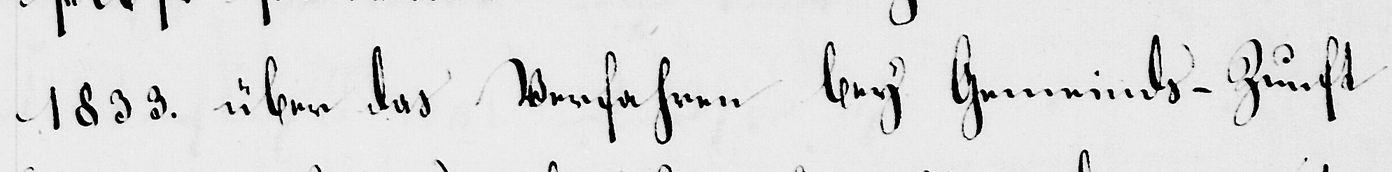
1833. über das Verfahren bey Gemeinds-Zunft
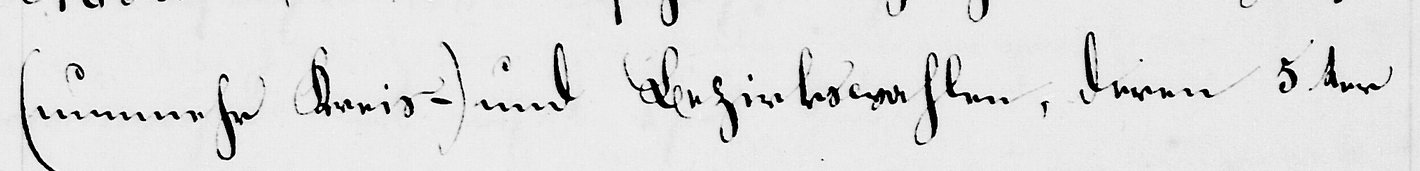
(nunmehr Kreis-) und Bezirkswahlen, deren 5.ten
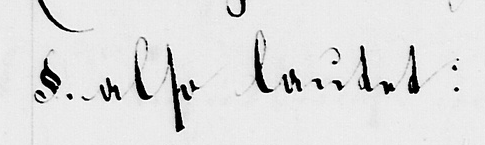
§. also lautet:
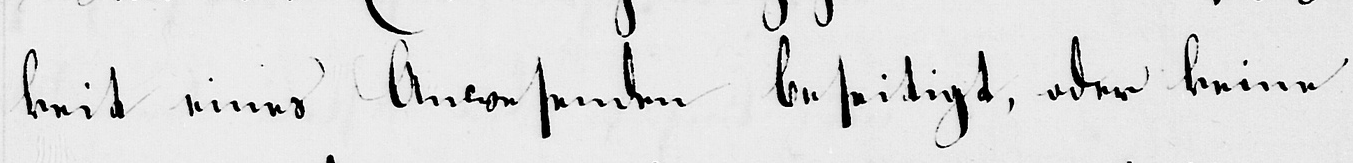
keit eines Anwesenden beseitigt, oder keine
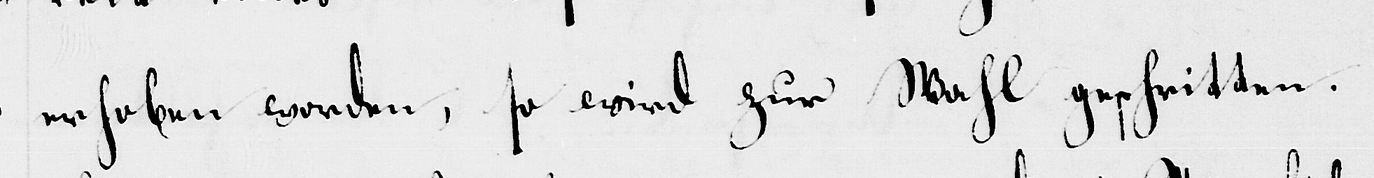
erhoben worden, so wird zur Wahl geschritten.
